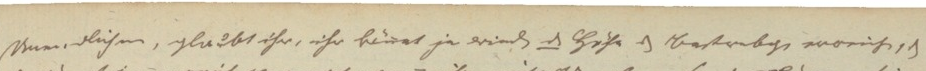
Unendlichen, glaubt ihr, ihr könnet je wieder die Höhe der Bestrebungen erreichen,
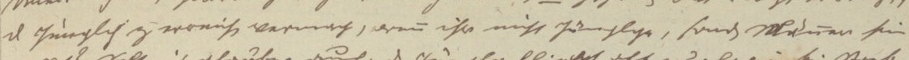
der Jüngling z erreichen vermag, wenn ihr nicht Jünglinge, sondern Männer sein
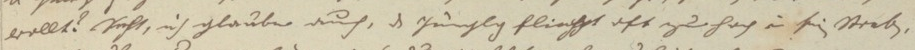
wollt? Seht, ich glaube auch, der Jüngling fliegt oft zu hoch in seinem Streben,
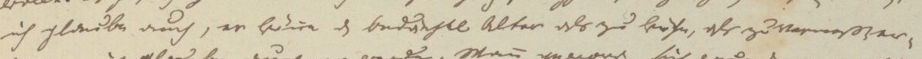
ich glaube auch, er könne dem bedächtl Alter als zu kühn, als zu vermessen er-
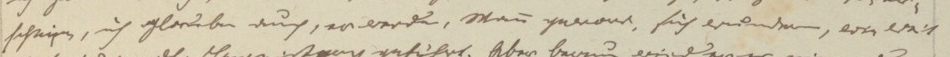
scheinen, ich glaube auch, er werde, Mann geworden, sich wundern, wie weit
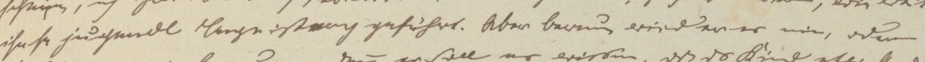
ihn seine jugendl. Begeisterung geführt. Aber bereuen wird er es nie, oder
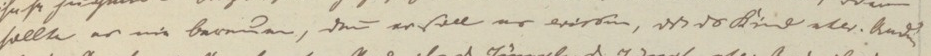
sollte es nie bereuen, denn er soll es wissen, dß ds Kind etw. Andres
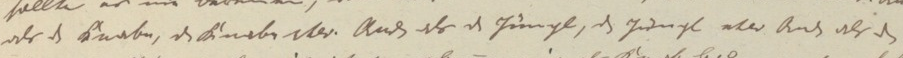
als der Knabe, der Knabe etw. Andres als der Jüngl., der Jüngl. etw. Andres als der
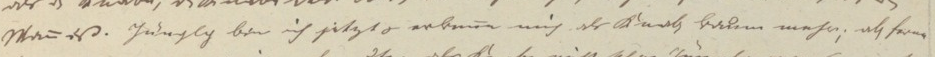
Mann ist. Jüngling bin ich jetzt & erkenne mich als Knaben kaum mehr; aber ferne
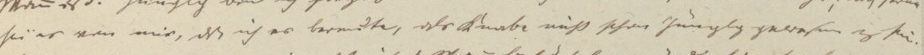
sei es von mir, dß ich es bereute, als Knabe nicht schon Jüngling gewesen z sein.
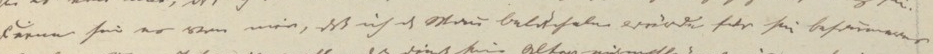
Ferne sei es von mir, dß ich den Mann belächeln würde für sein besonneres
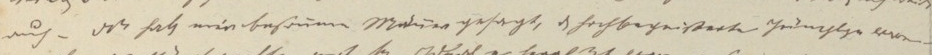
auch – dß haben mir besonnene Männer gesagt, d. hochbegeisterte Jünglinge waren –
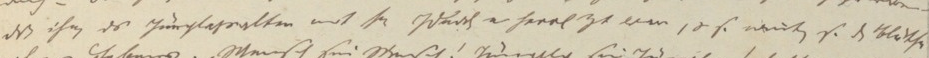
dß ihnen ds Jünglingsalter mit sn Idealen e herrl Zt war, & s. nannten s. die Blüthe
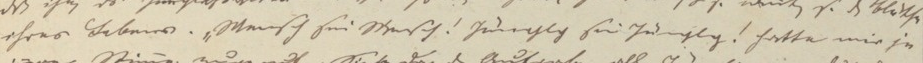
ihres Lebens. «Mensch sei Mensch! Jüngling sei Jüngling!» hatte mir jene
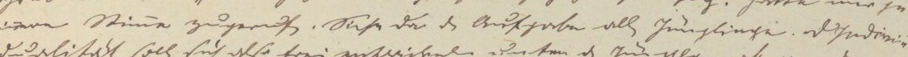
innere Stimme zugerufen. Siehe da die Aufgabe aller Jünglinge. Die Indivi-
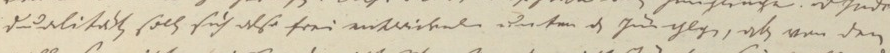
dualitäten sollen sich also frei entwickeln unter den Jünglingen, aber von denen
